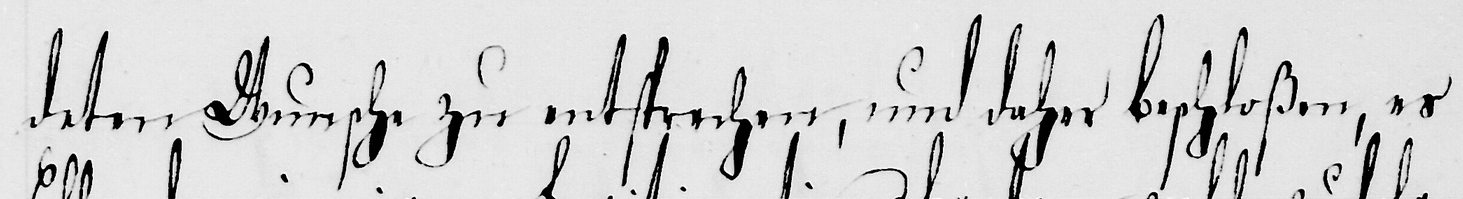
deten Wunsche zu entsprechen, und daher beschloßen, es
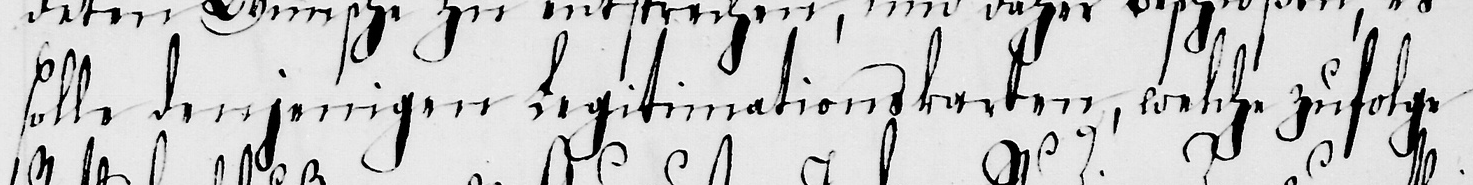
olle denjenigen Legitimationskarten, welche zufolge
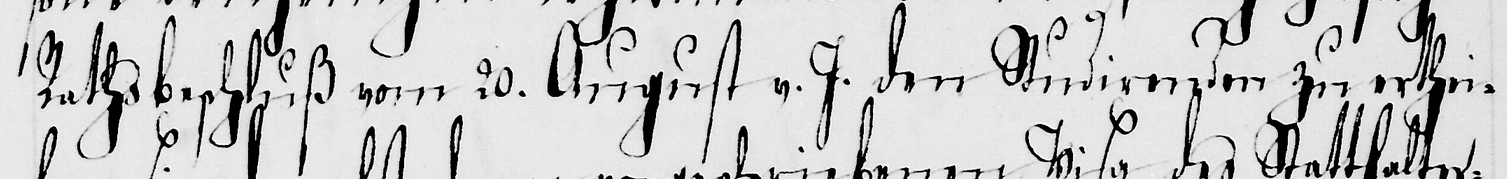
Rathsbeschluß vom 20. August v. J. den Studierenden zu erthei¬
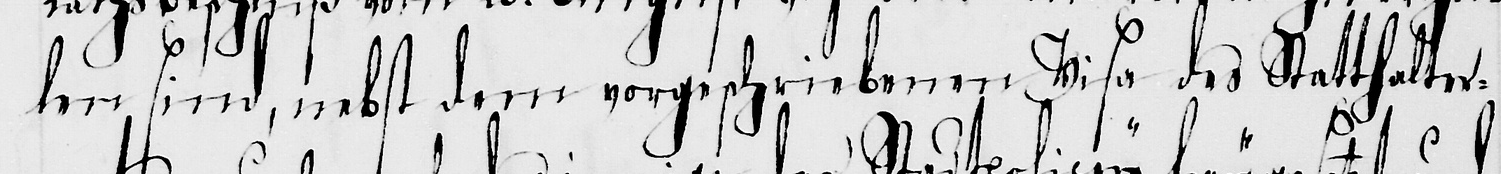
len sind, nebst dem vorgeschriebenen Visa des Statthalter¬
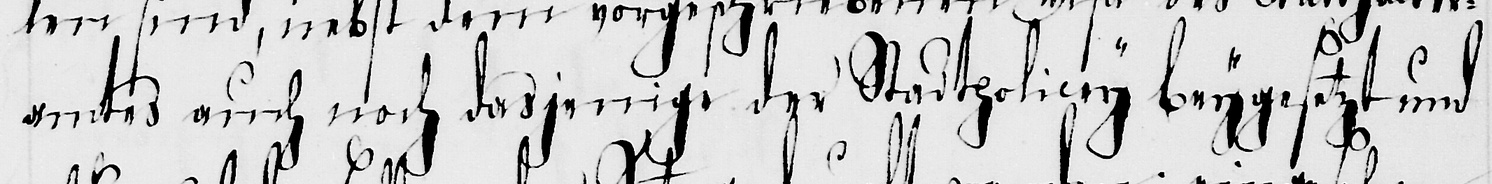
amtes auch noch dasjenige der Stadtpolicey beygesetzt und
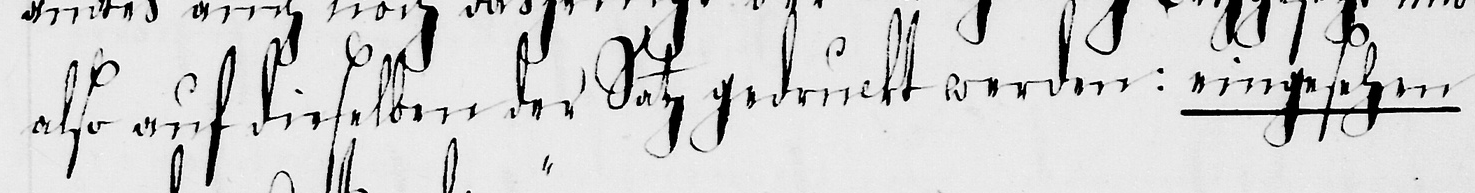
also auf dieselben der Satz gedruckt werden: eingesehen
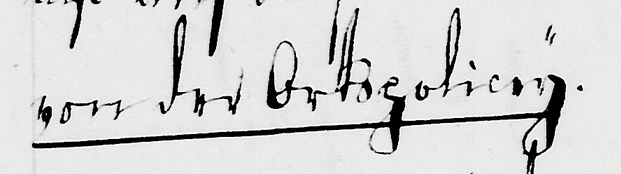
von der Ortspolicey.
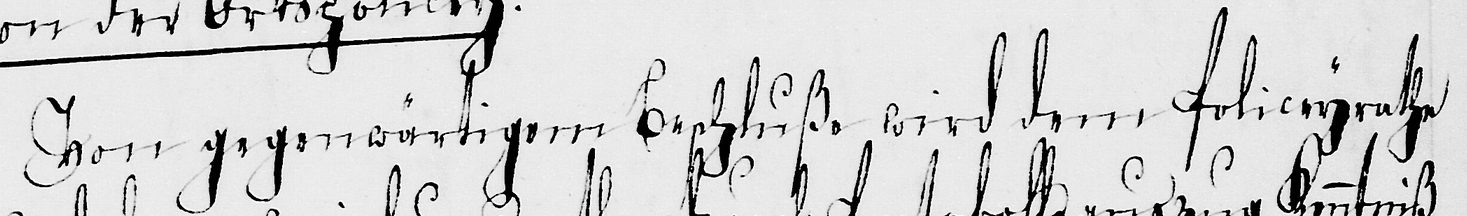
Von gegenwärtigem Beschluße wird dem Policeyrathe
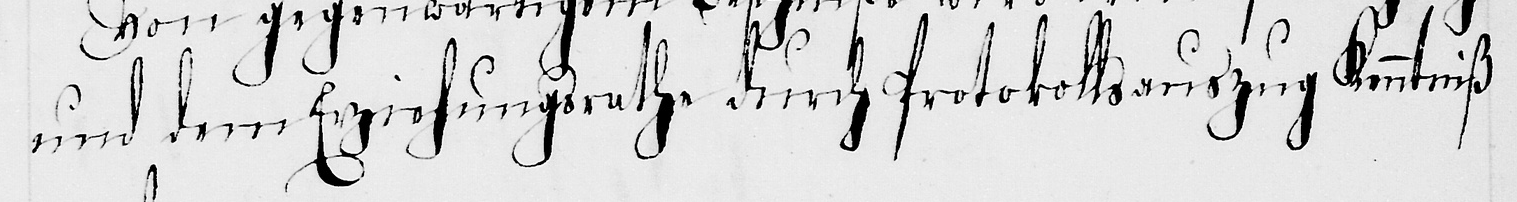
und dem Erziehungsrathe durch Protokollsauszug Kenntniß
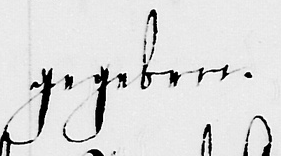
gegeben.
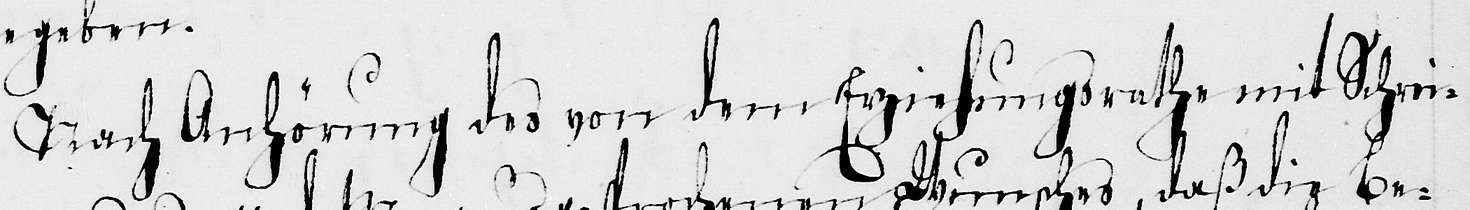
Nach Anhörung des von dem Erziehungsrathe mit Schrei¬
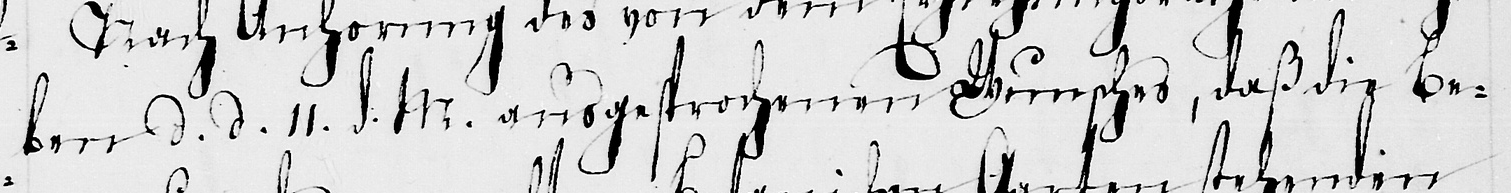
ben d d. 11. d. M. ausgesprochenen Wunsches, daß die Be¬
